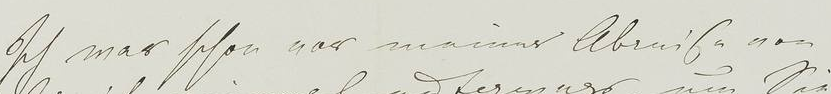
Ich war schon vor meiner Abreise von
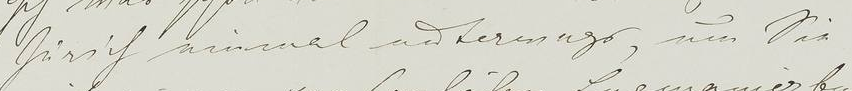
Zürich einmal unterwegs, um Sie
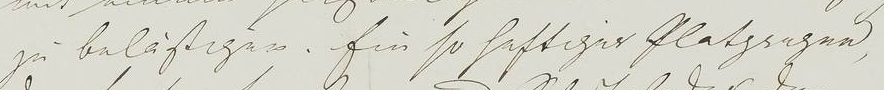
zu belästigen. Ein so heftiger Platzregen,
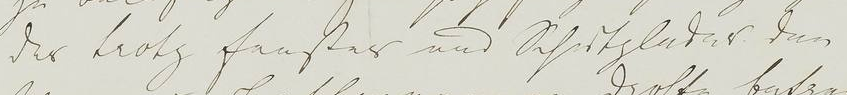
der trotz Fenster und Schutzleder den
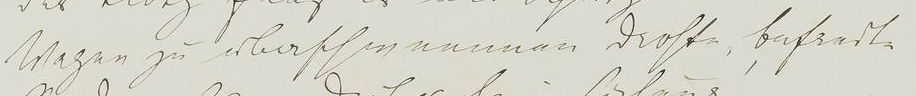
Wagen zu überschwemmen drohte, befreite
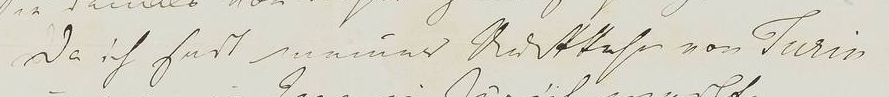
Da ich seit meiner Rückkehr von Turin
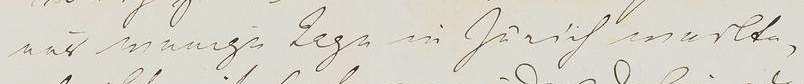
nur wenige Tage in Zürich weilte,
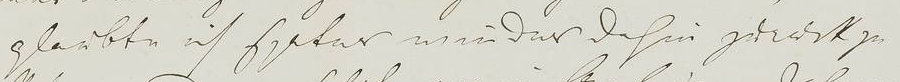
glaubte ich später wieder dahin zurück zu
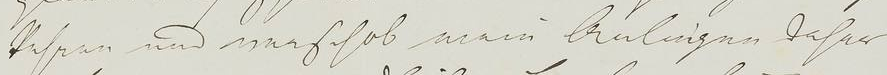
kehren und verschob mein Anliegen daher
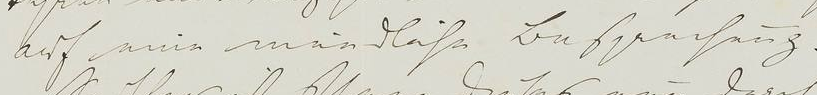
auf eine mündliche Besprechung.
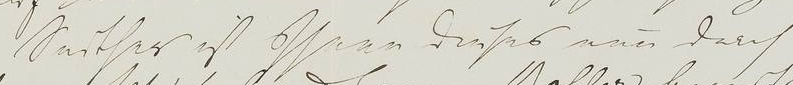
Seither ist Ihnen dieses nun durch
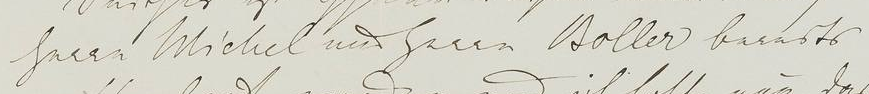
Herrn Michel und Herrn Boller bereits
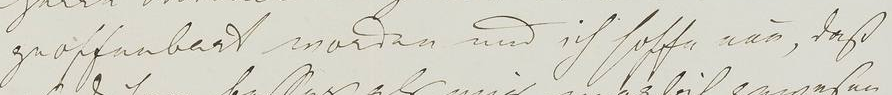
geoffenbart worden und ich hoffe nun, daß
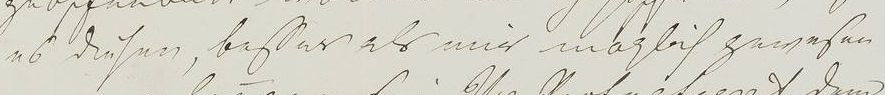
es diesen, besser als mir möglich gewesen
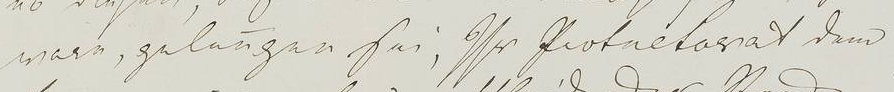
wäre, gelungen sei, Ihr Protectorat dem
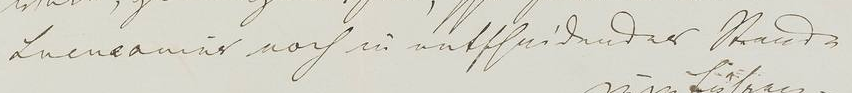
Lucmanier noch in entscheidender Stunde
